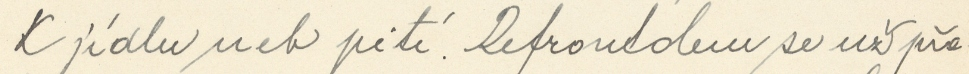k jídlu neb pití. Refrontolem se už pře-
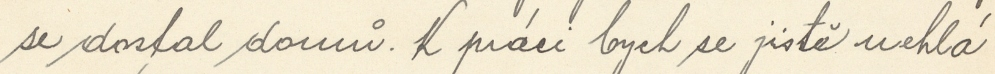se dostal domů. K práci bych se jistě nehlá-
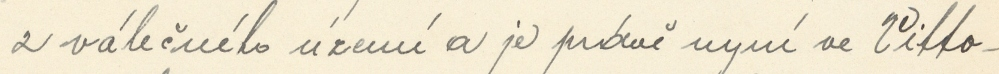z válečného území a je právě nyní ve Vitto-
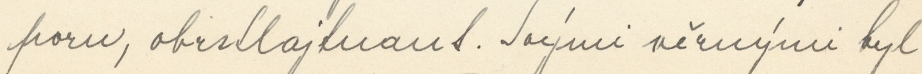poru, obrstlajtnant. Svými věrnými byl
